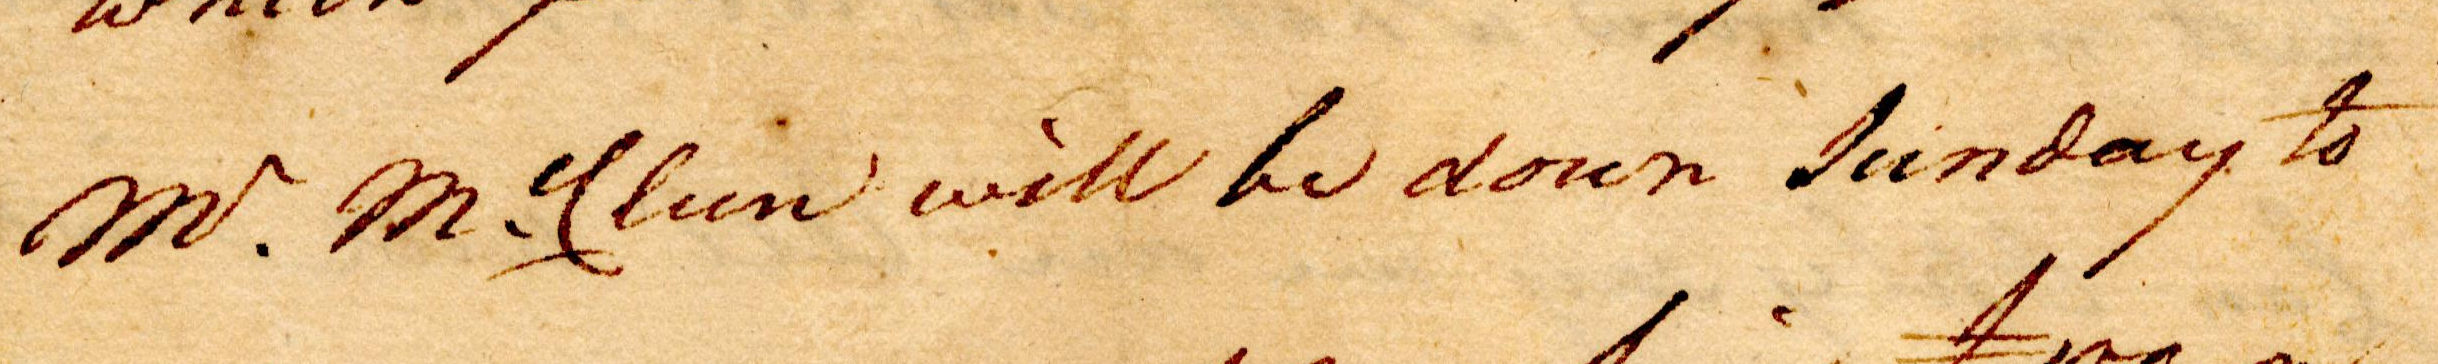M^r. M^c.Clun will be down Sunday to
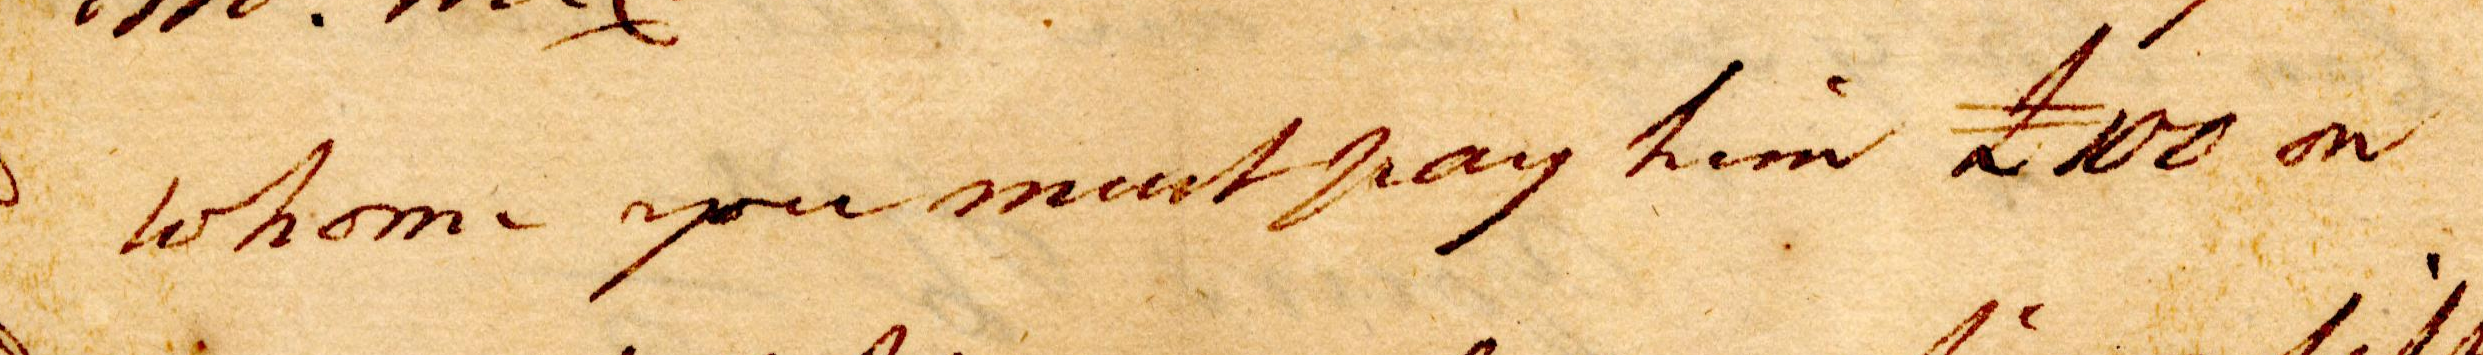whome you must pay him £100 on
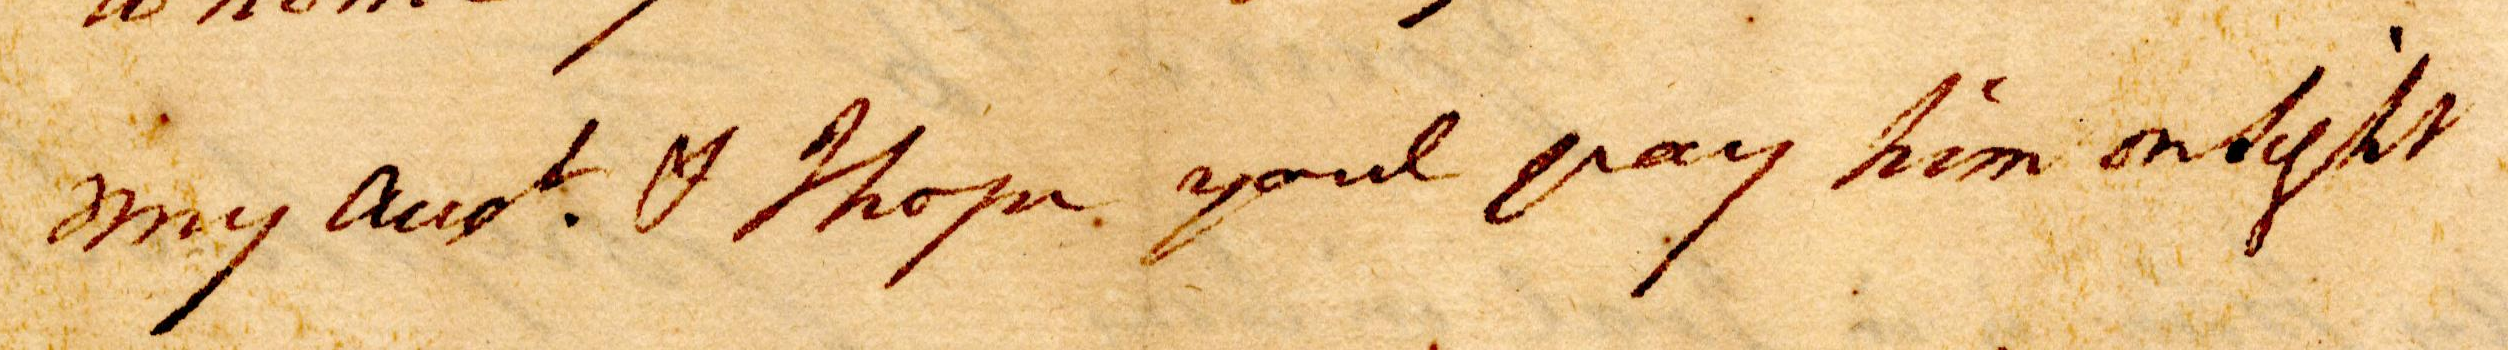my Acco^t. & I hope youl pay him only his
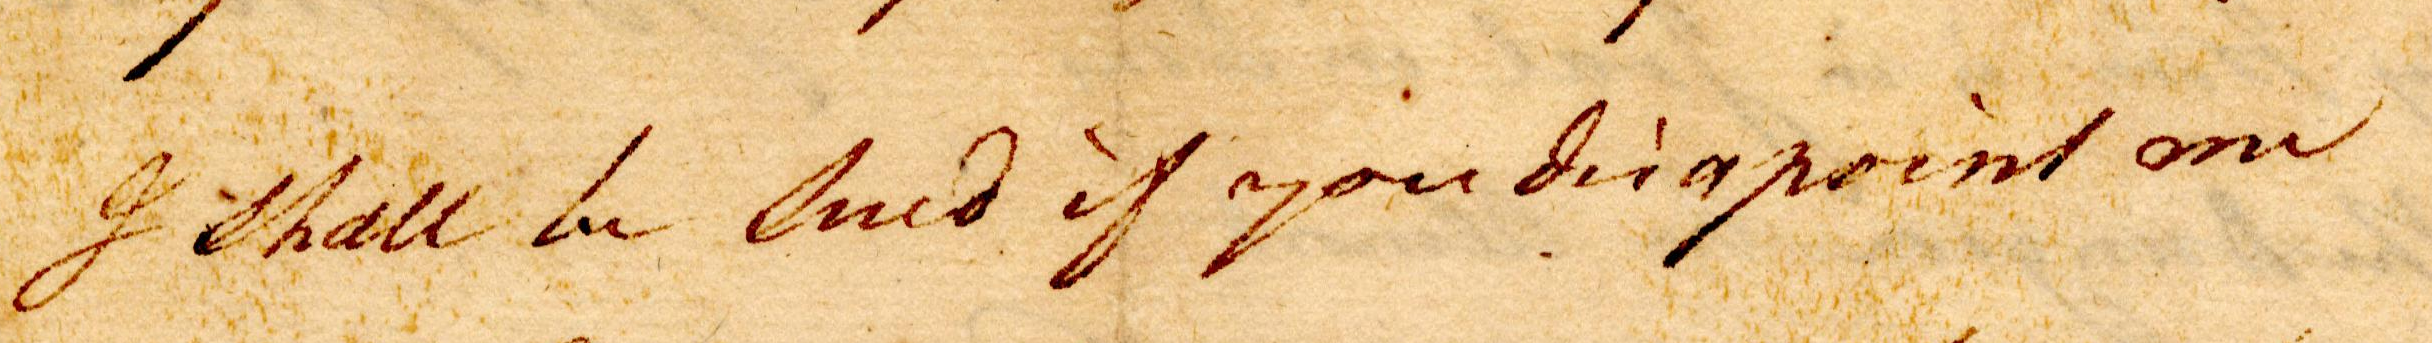I shall be sued if you disapoint on
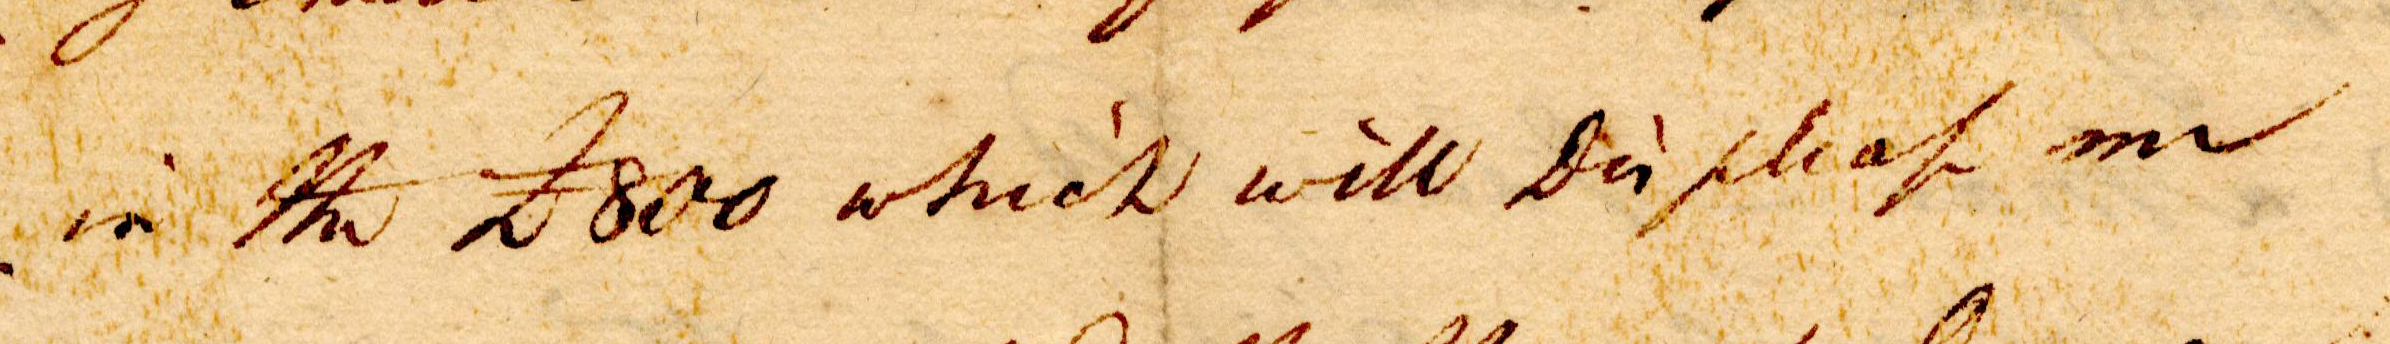in the £800 which will dispose me
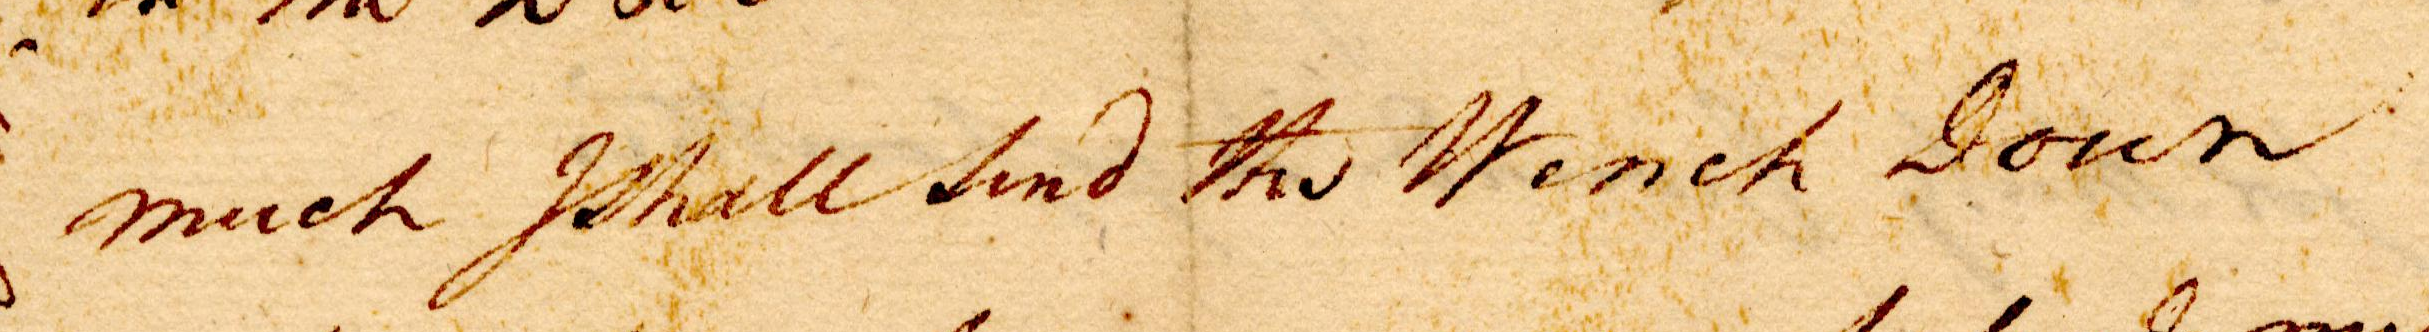much I shall Send the Wench Down
